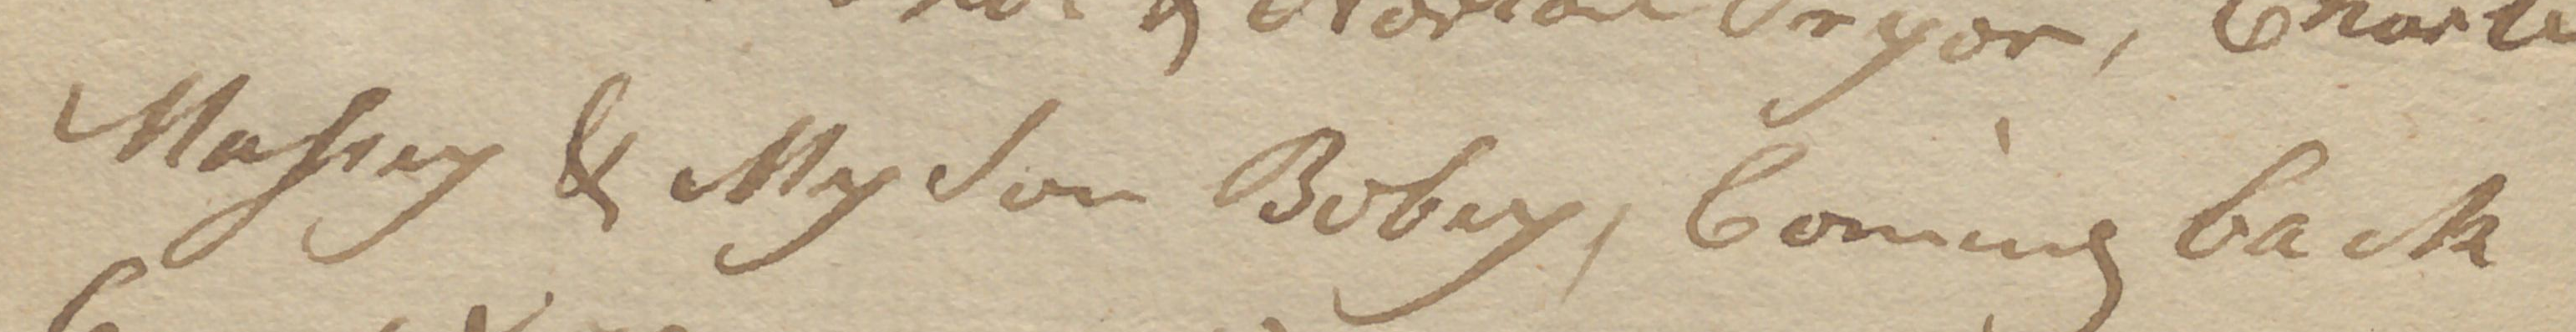Massey & My Son Bobey, Coming back
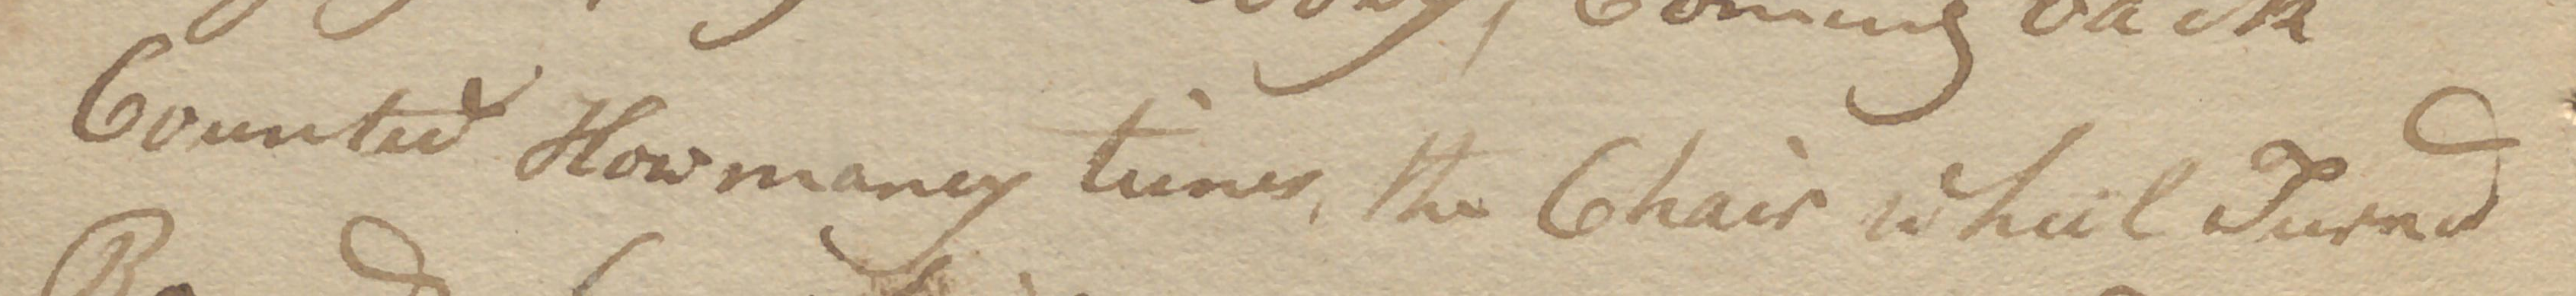Counted How many times, the Chair wheel Turnd
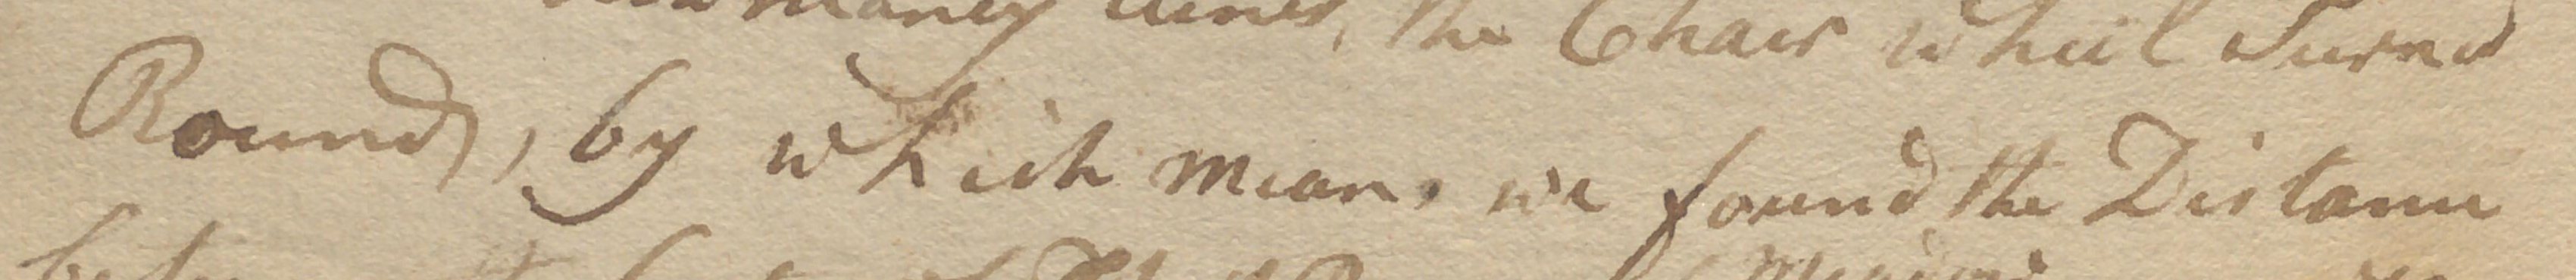Round, by which means we found the Distance
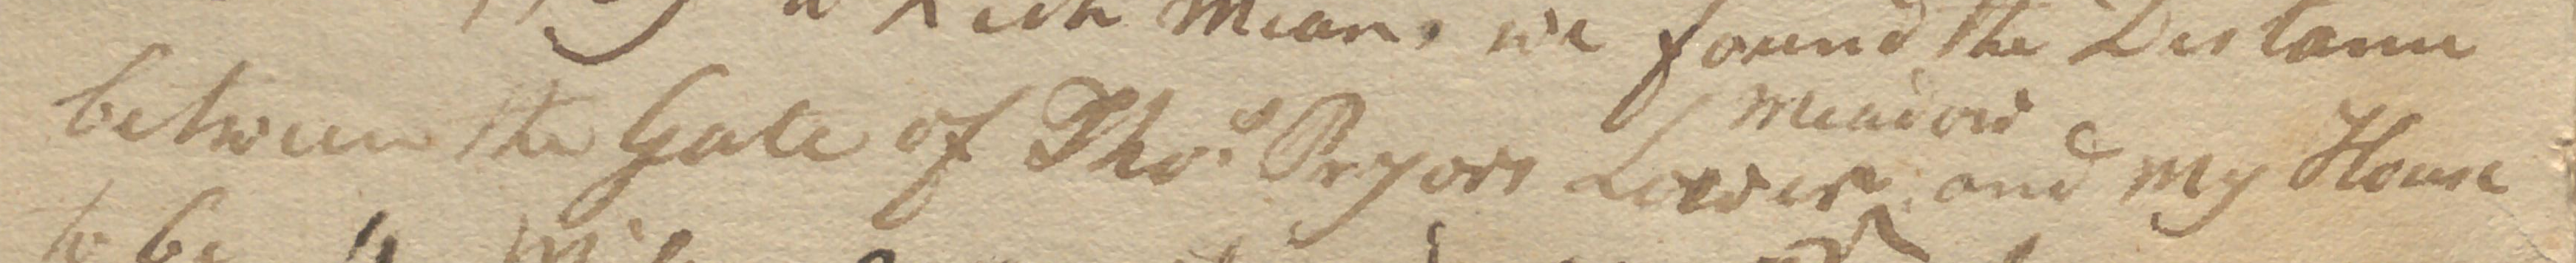between the Gate of Tho^s. Pryors Lower ^ and my House
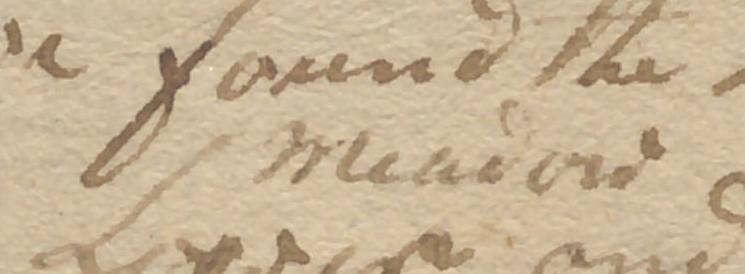meadow
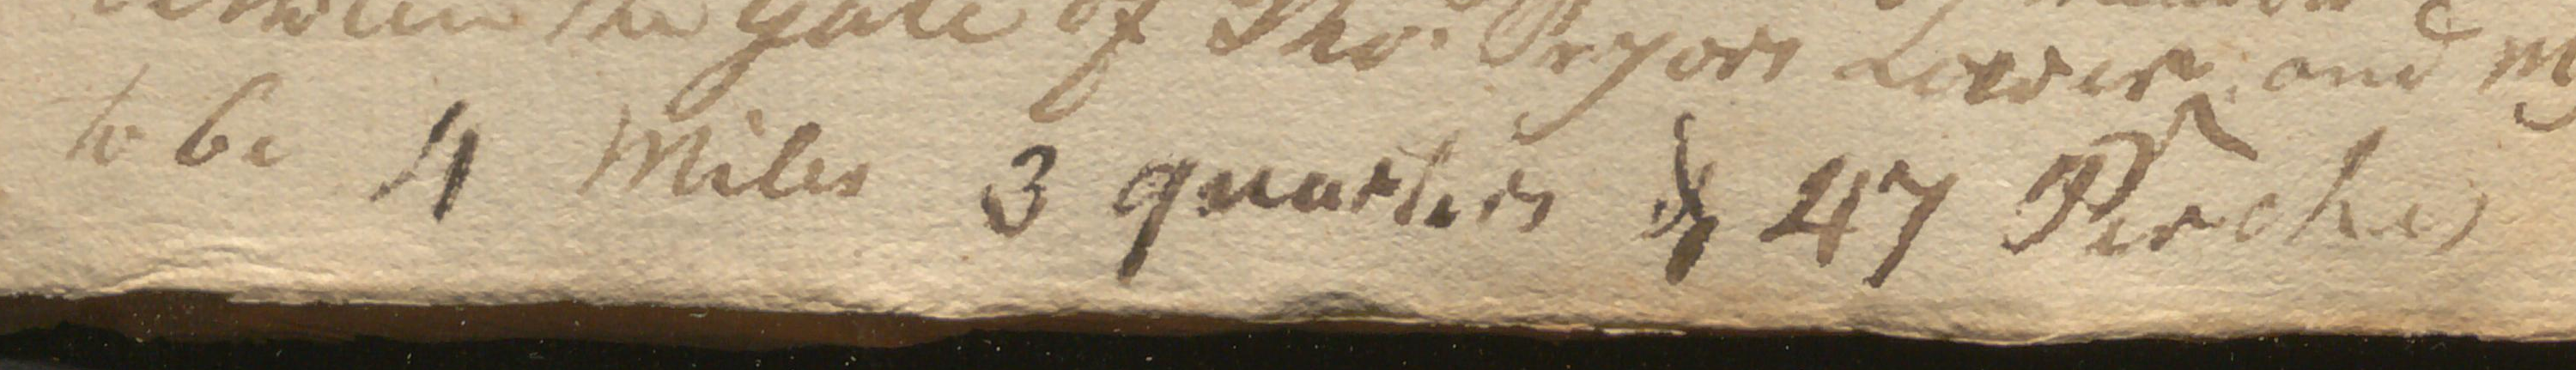to be 4 Miles 3 quarters & 47 Perches
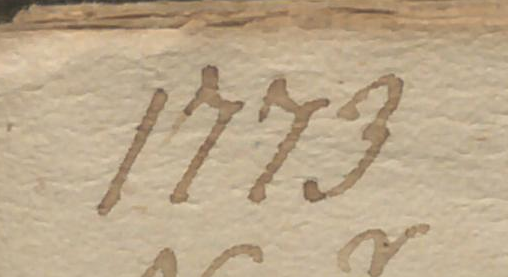1773
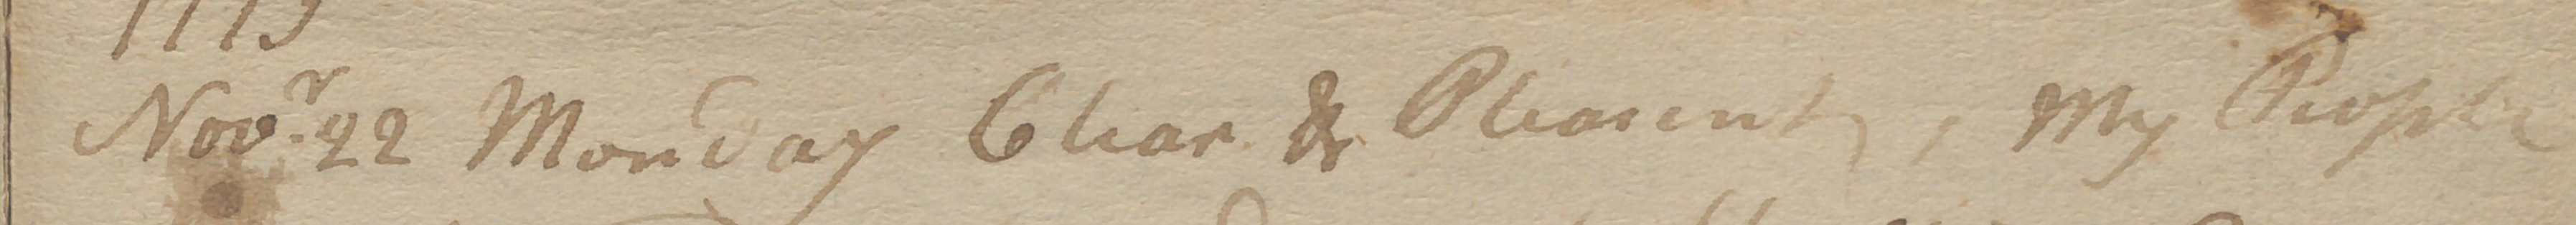Nov^r. 22 Monday Clear & Pleasent, My People
